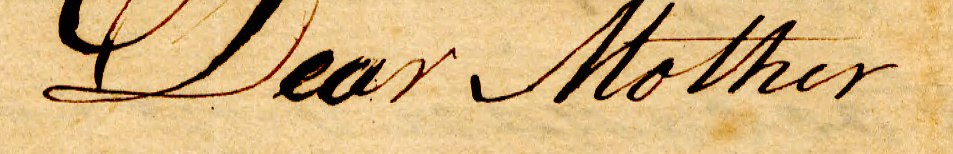Dear Mother
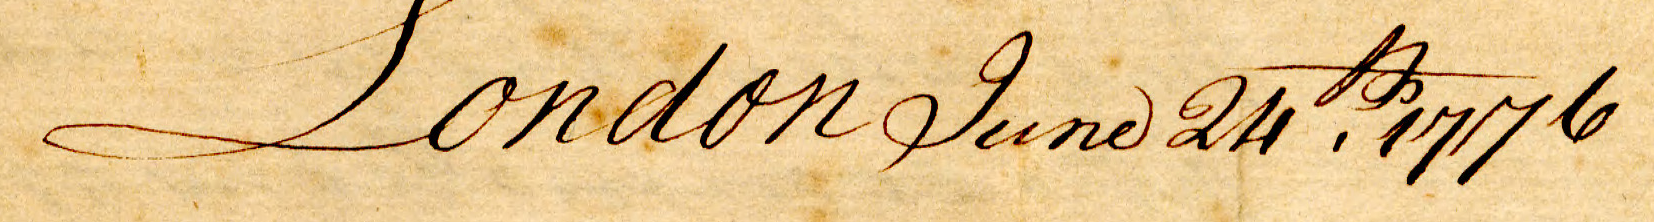London June 24^th. 1776
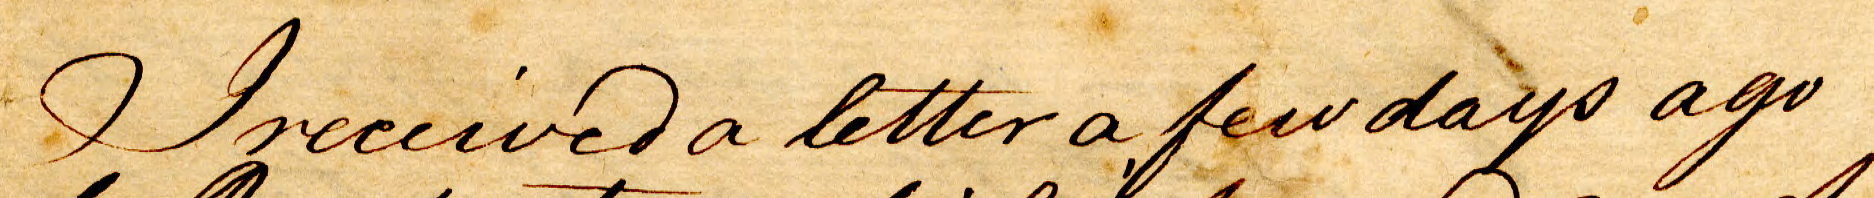I received a letter a few days ago
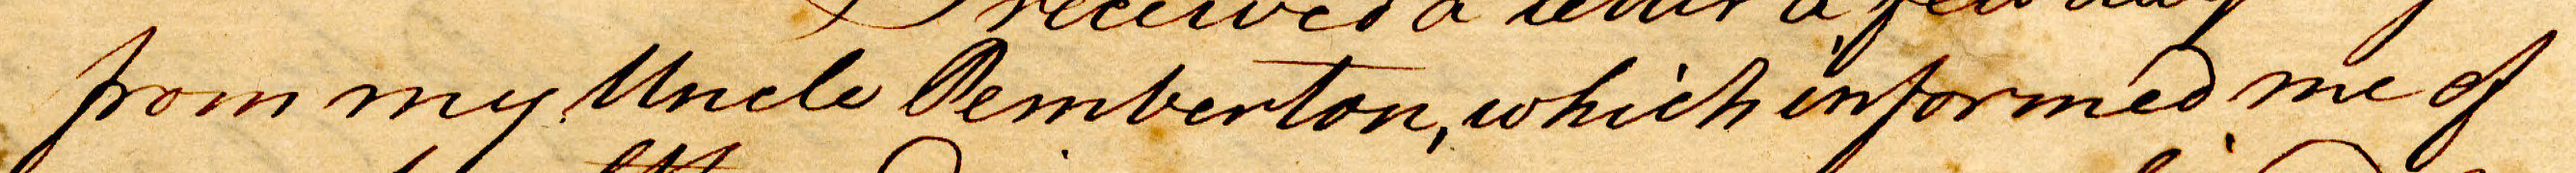from my Uncle Pemberton, which informed me of
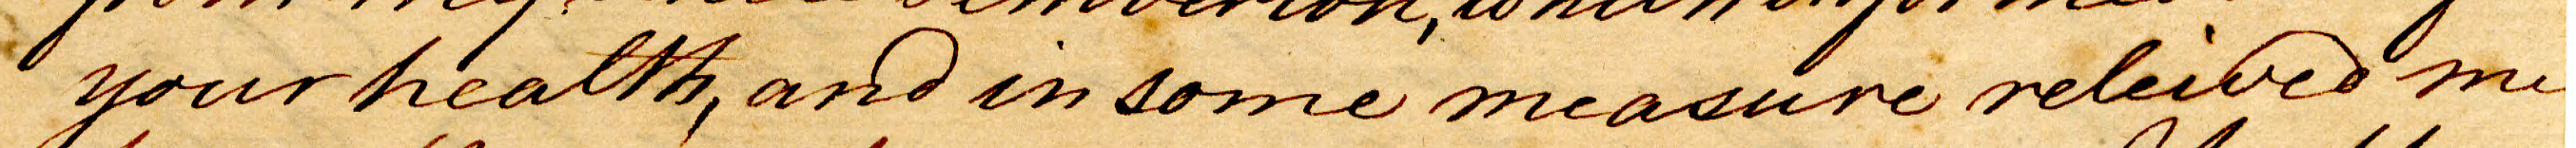your health, and in some measure releived me
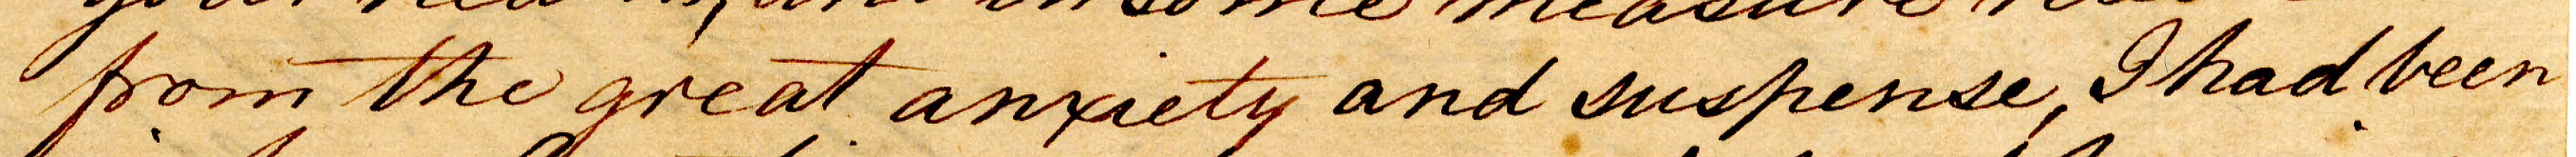from the great anxiety and suspense, I had been
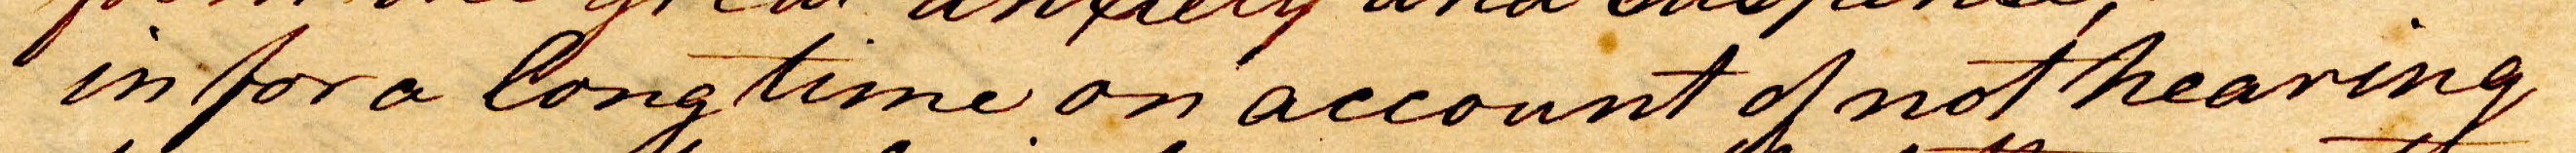in for a long time on account of not hearing
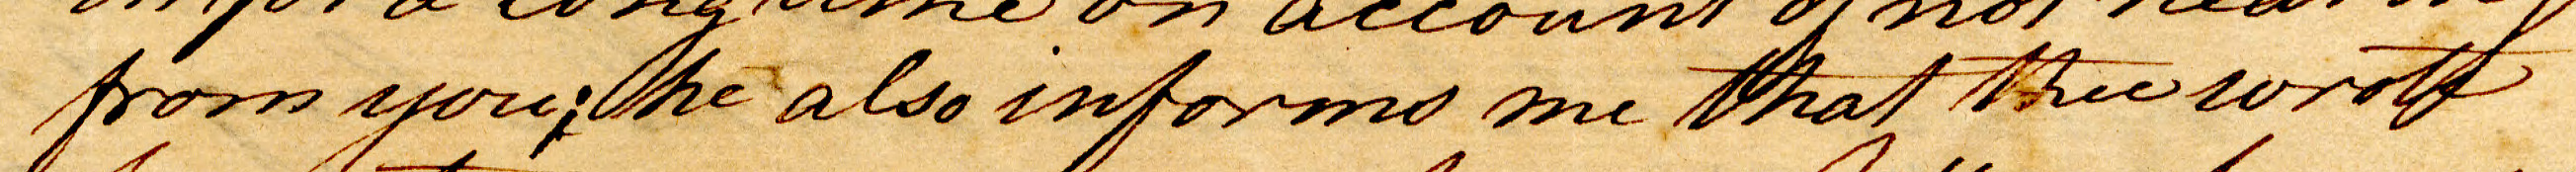from you; he also informs me that thee wrote
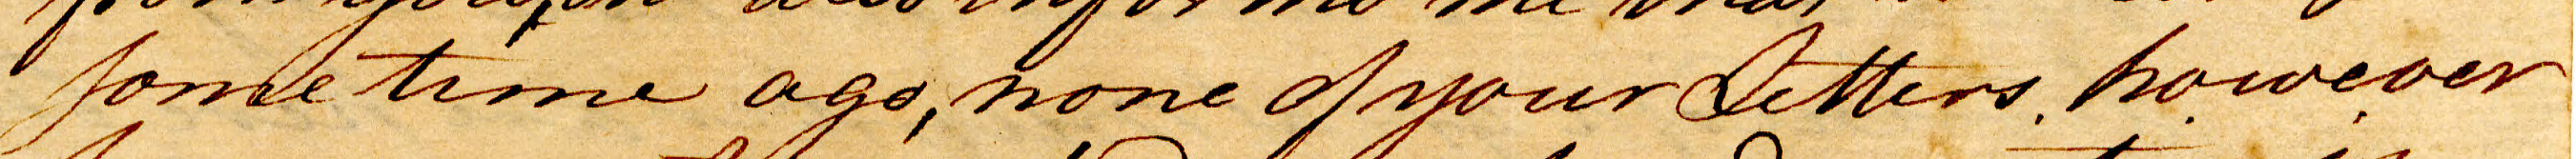some time ago, none of your Letters however
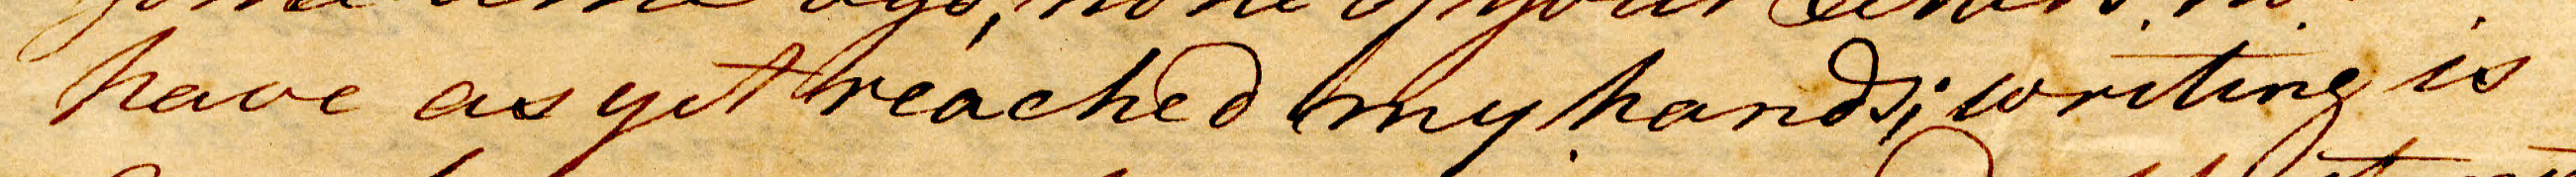have as yet reached my hands; writing is
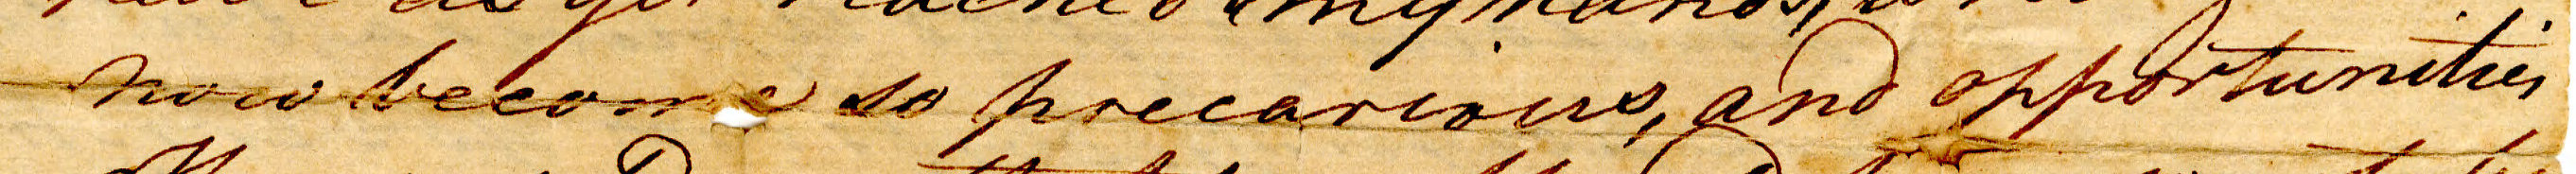now become so precarious, and opportunities
